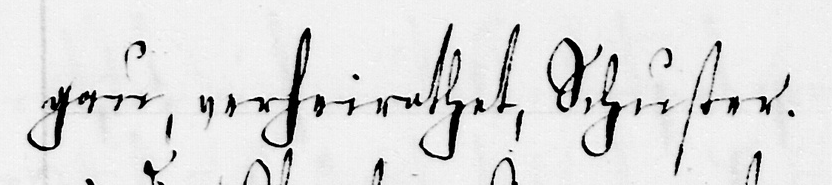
gau, verheirathet, Schuster.
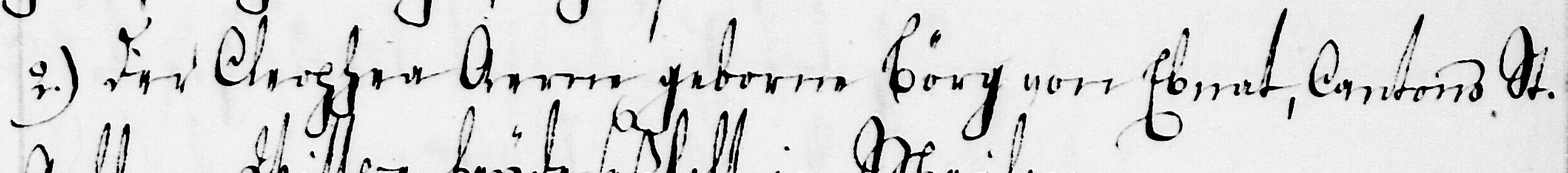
2.) Der Cleophea Aerne geborne Börg von Ebnat, Cantons St.
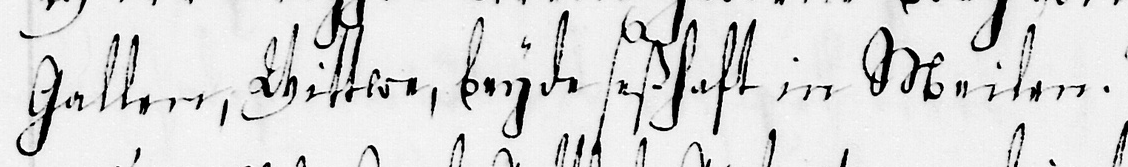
Gallen, Wittwe, beyde seßhaft in Meilen.
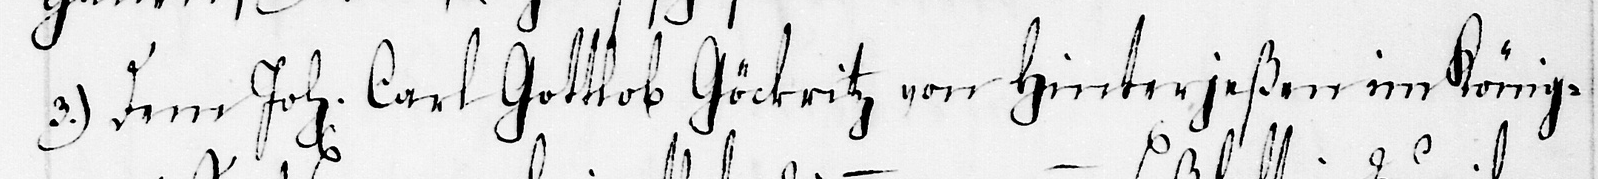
3.) Dem Joh. Carl Gottlob Göckritz von Hinterjeßen im König¬
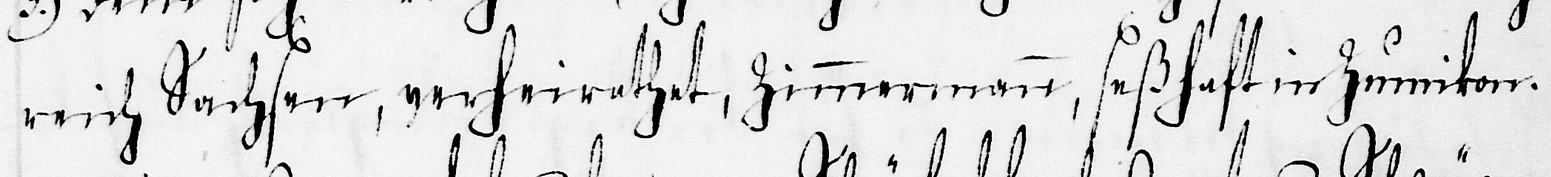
reich Sachsen, verheirathet, Zimmermann, seßhaft in Zumikon.
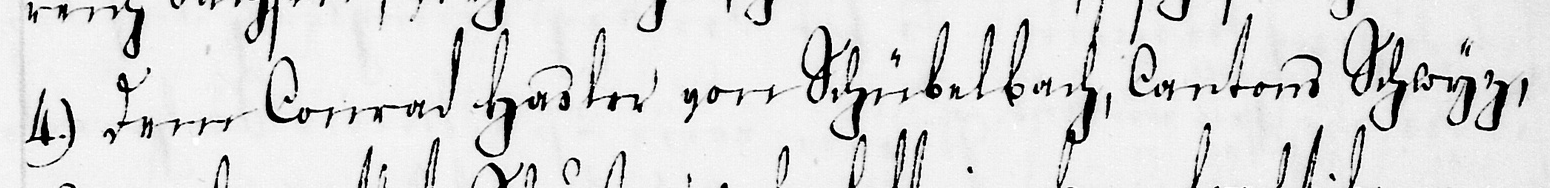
4.) Dem Conrad Hasler von Schübelbach, Cantons Schwyz,
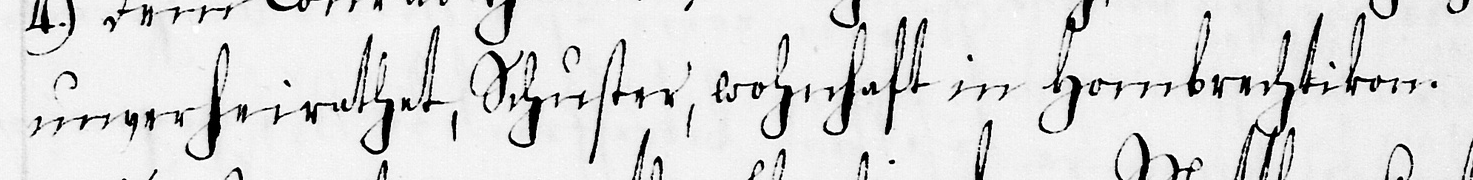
unverheirathet, Schuster, wohnhaft in Hombrechtikon.
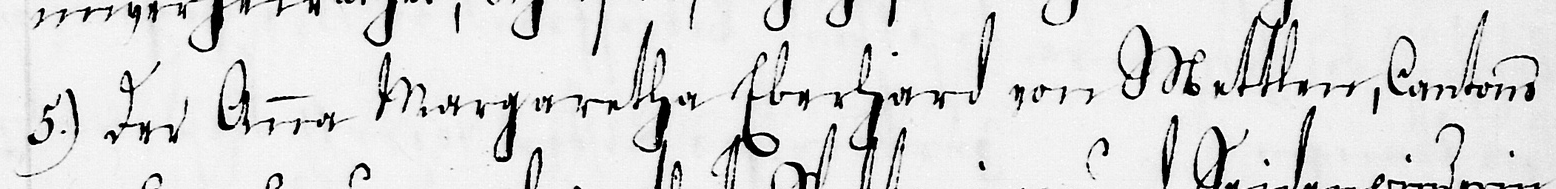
5.) Der Anna Margaretha Eberhard von Mettlen, Cantons
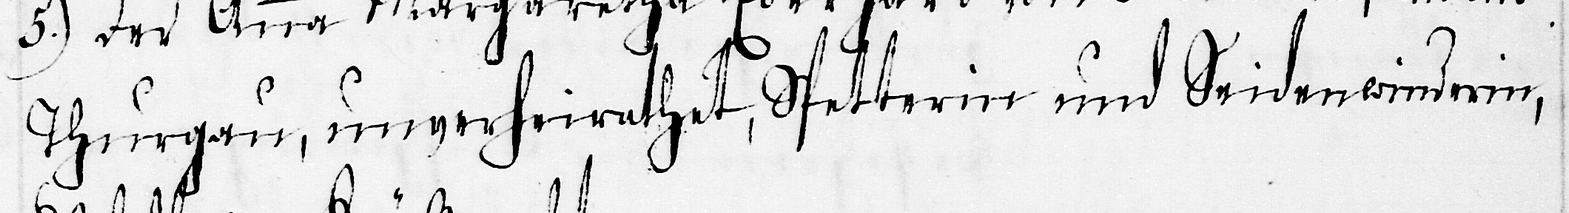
Thurgau, unverheirathet, Spetterin und Seidenwinderin,
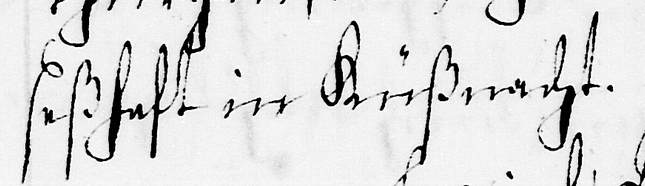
seßhaft in Küßnacht.
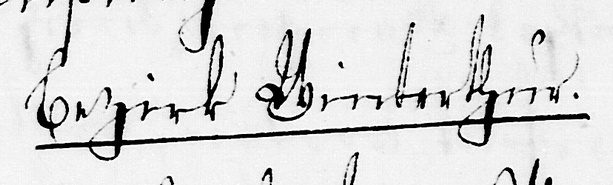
Bezirk Winterthur.
